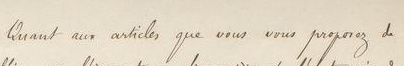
Quant aux articles que vous vous proposez de
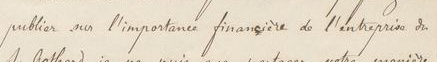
publier sur l'importance financière de l'entreprise du
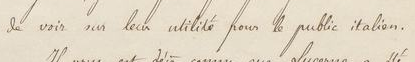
de voir sur leur utilité pour le public italien.
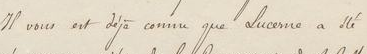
Il vous est déjà connu que Lucerne a été
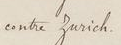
contre Zurich.
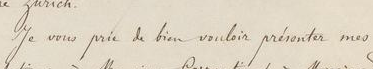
Je vous prie de bien vouloir présenter mes
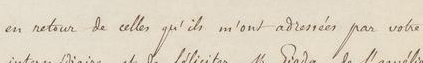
en retour de celles qu'ils m'ont adressées par votre
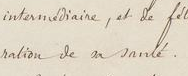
ration de sa santé.
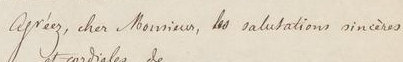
Agréez, cher Monsieur, les salutations sincères
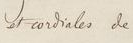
et cordiales de
